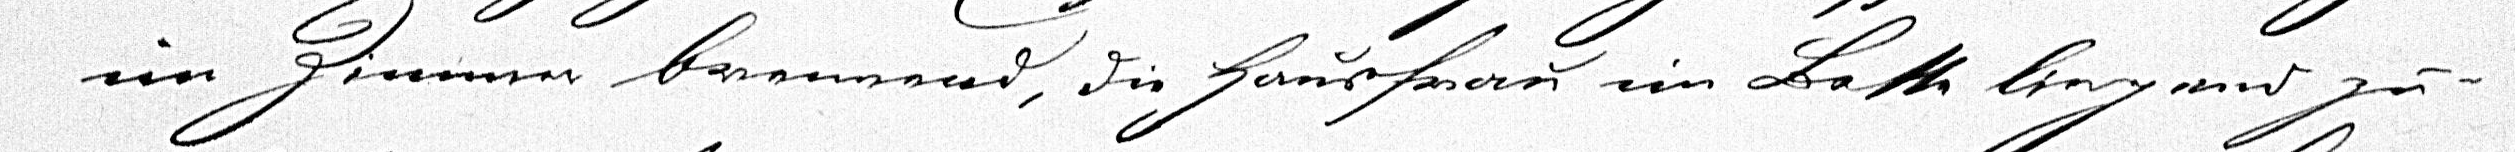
ein Zimmer brewend, die Hausfrau ein Bosse liegend zu¬
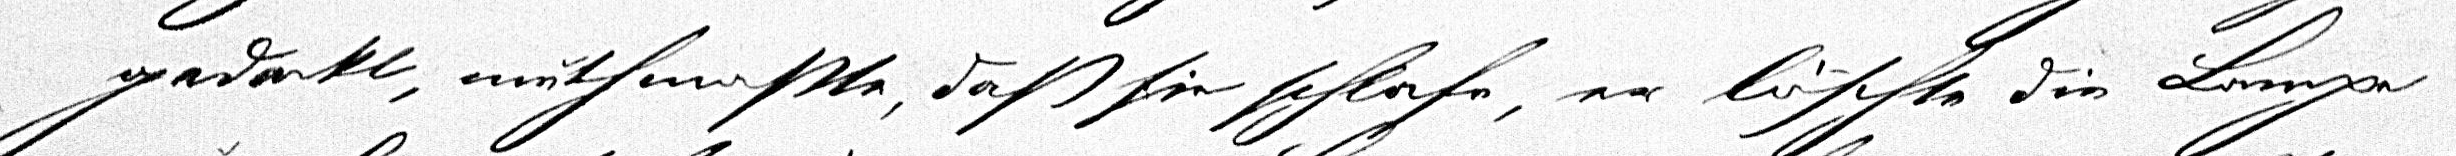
gedeckt, muthmaßte, daß sie schlafe, er löschte die Lange
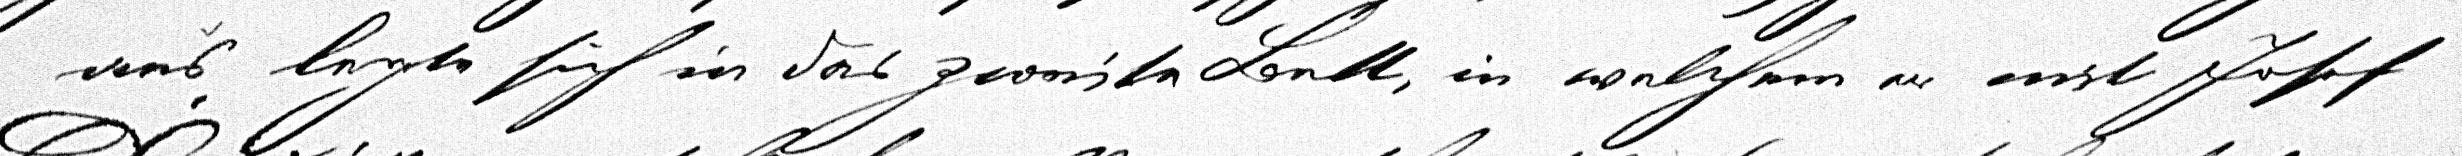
aus legte sich in das zweite Bett, in welchem er mit Josef
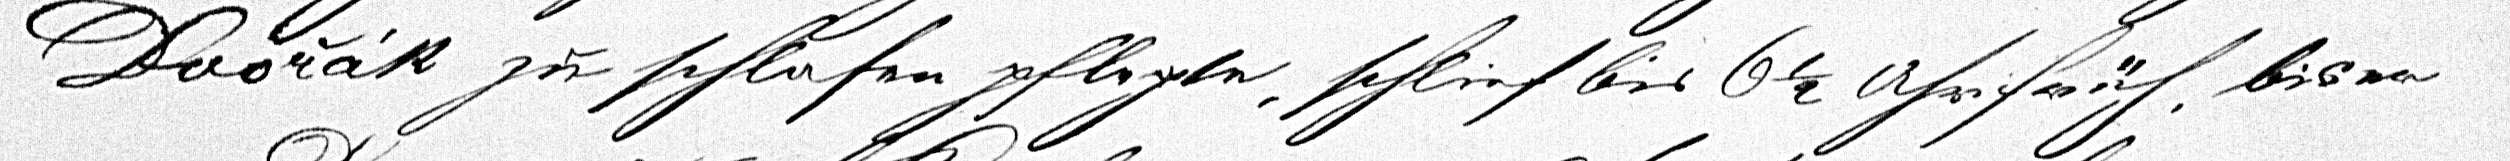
Dvořák zu schlafen pflegte, schlief bis 6 1/2 Uhr früh, bis er
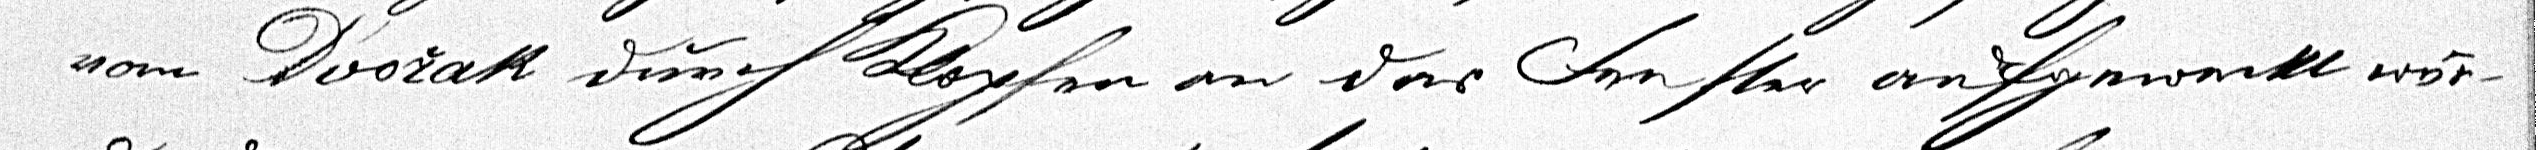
vom Dvořak durch Klopfen an das Fenster aufgeweckt wür¬
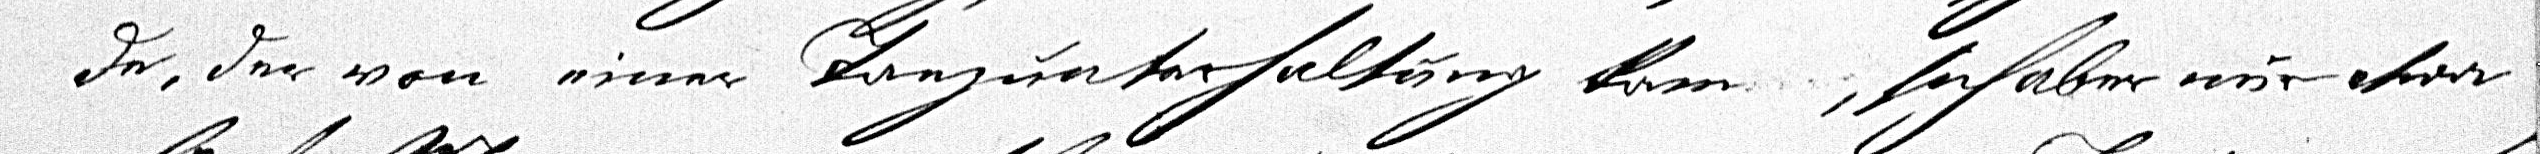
de, der von einer Tanzunterhaltung kam, Schaber nur dar
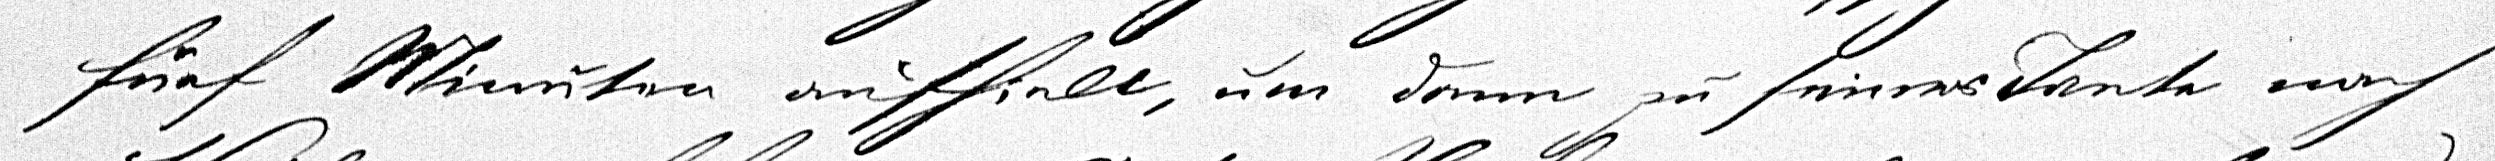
fünf Minuten aufhielt, um dann zu seines Trete noch
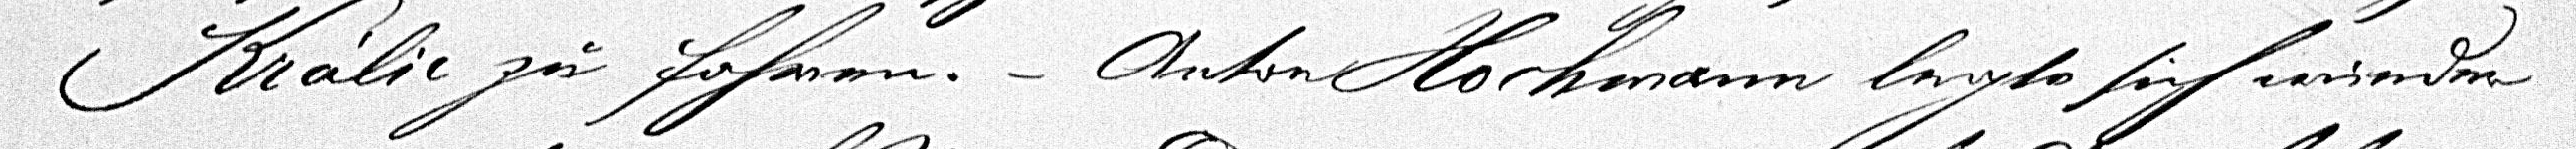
Králic zu fahren. - Anton Hochmann legte sich wieder
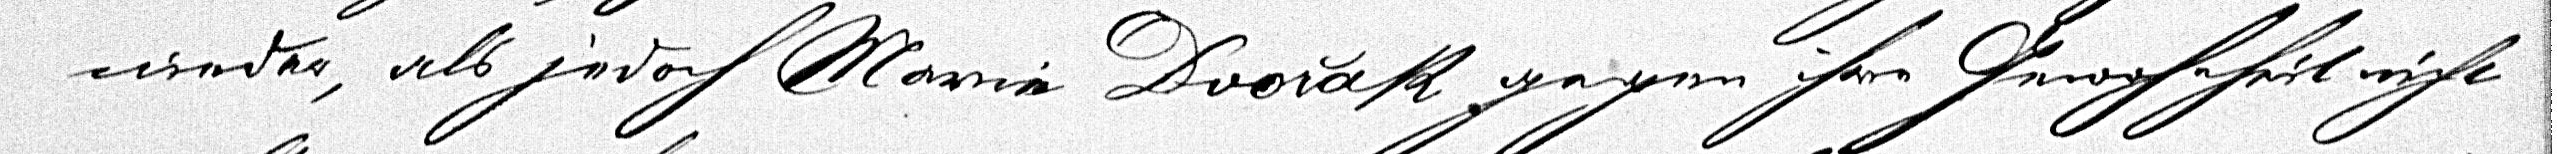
nieder, als jedoch Marie Dvořak gegen ihre Gewohnheit nicht
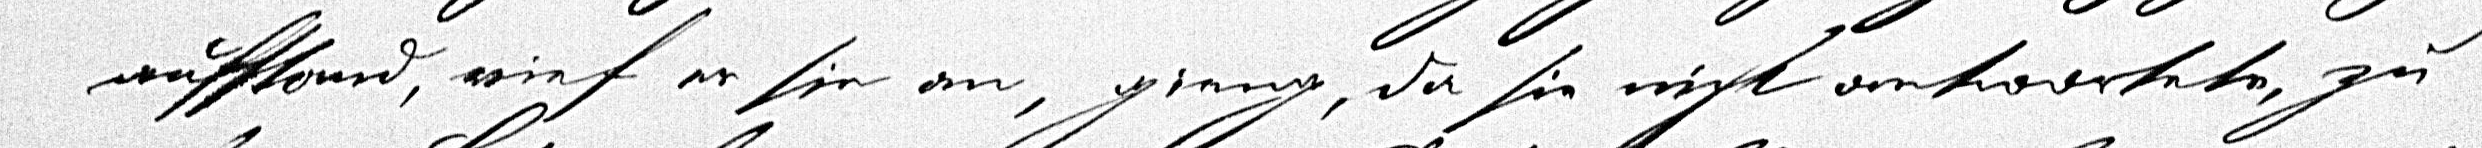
aufstand, rief er sie an, grenz, da sie nicht antwortete, zu
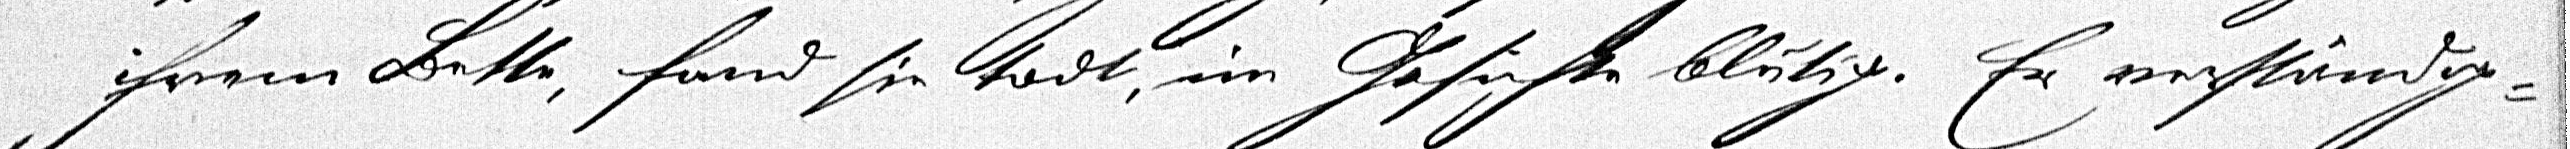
ihrem Bette, fand sie todt, im Gesichte blutig. Er verständig¬
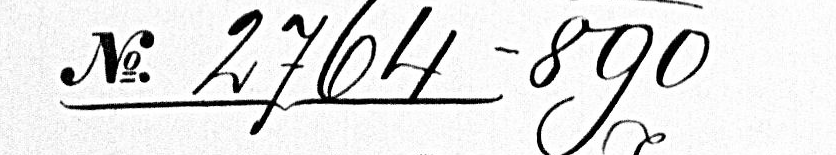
N° 2764-890
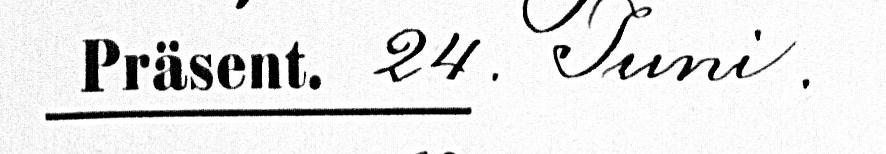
Präsent. 24. Juni.
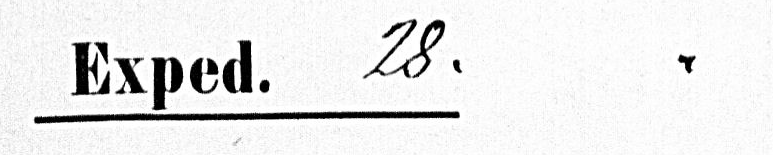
Exped. 28. Juni.
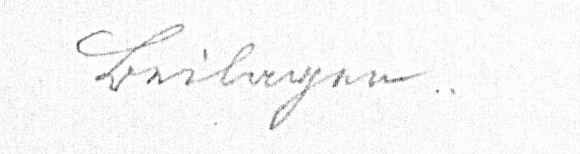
Beilagen.
